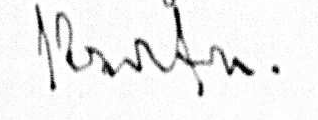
strafe.
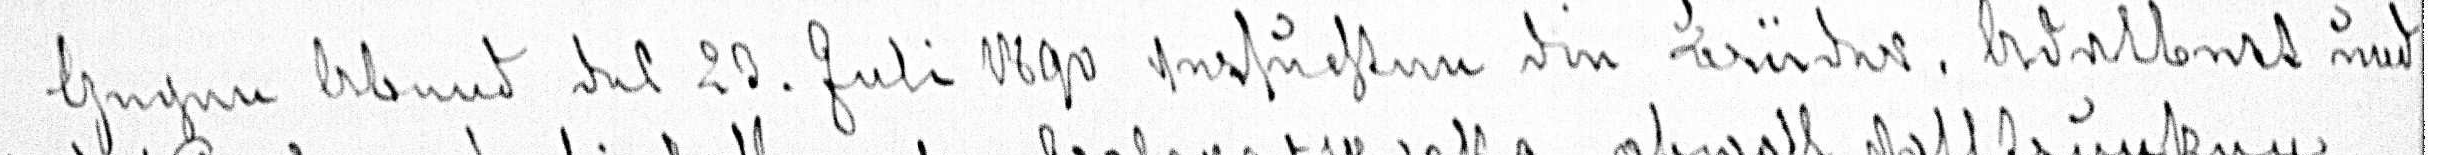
Gegen Abend des 23. Juli 1890 versuchten die Brüder, Adalbert und
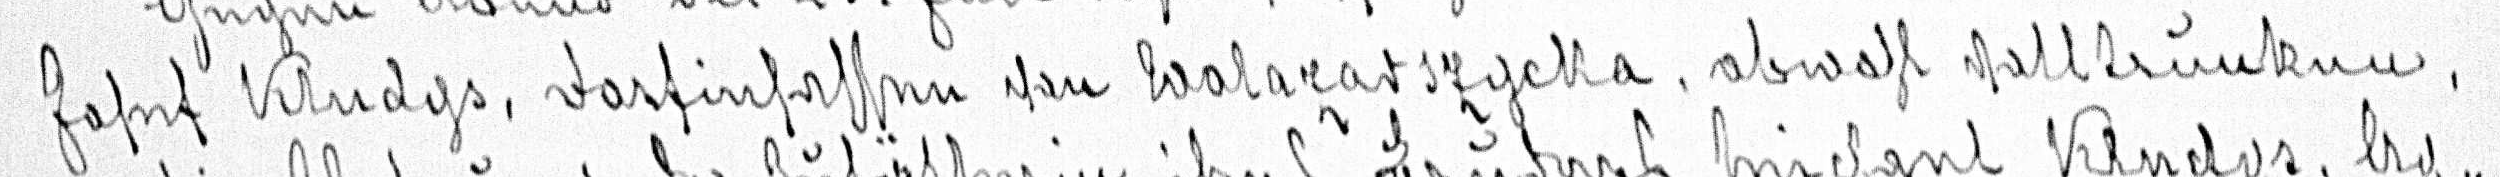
Josef Kludys Dorfinsassen von Walazadszycka, obwohl volltrunken,
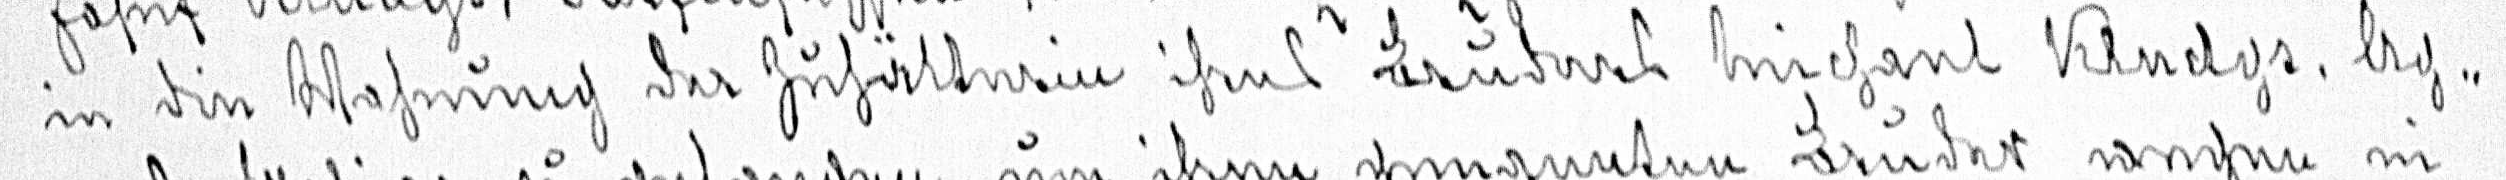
in die Wohnung der Zuhälterin ihres Bruders Michael Kludys, Ag¬
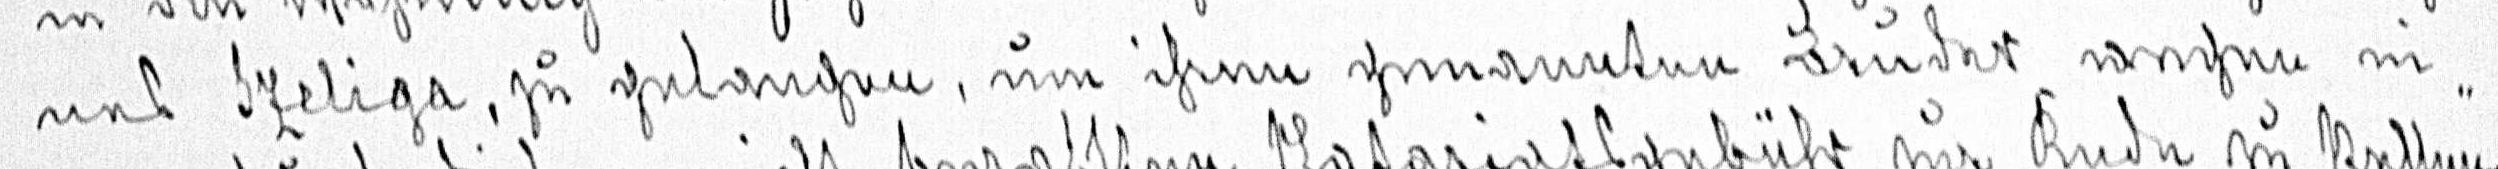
nes Szeliga, zu gelangen, um ihren genannten Bruder wegen ei¬
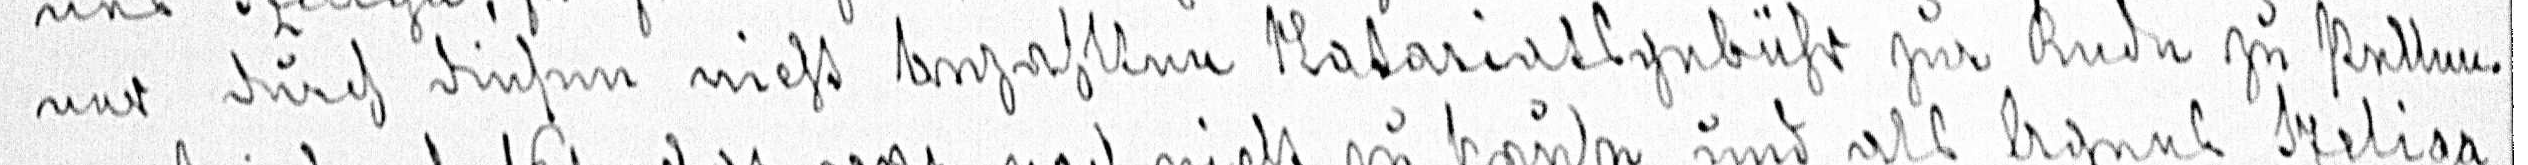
ner durch diesen nicht bezahlten Notariatsgebühr zur Rede zu stellen.
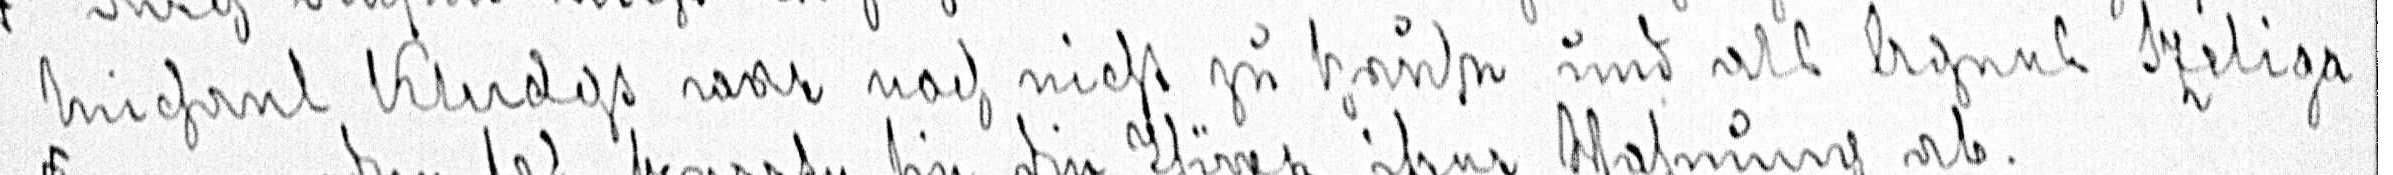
Michael Kludys war noch nicht zu Hause und als Agnes Szeliga
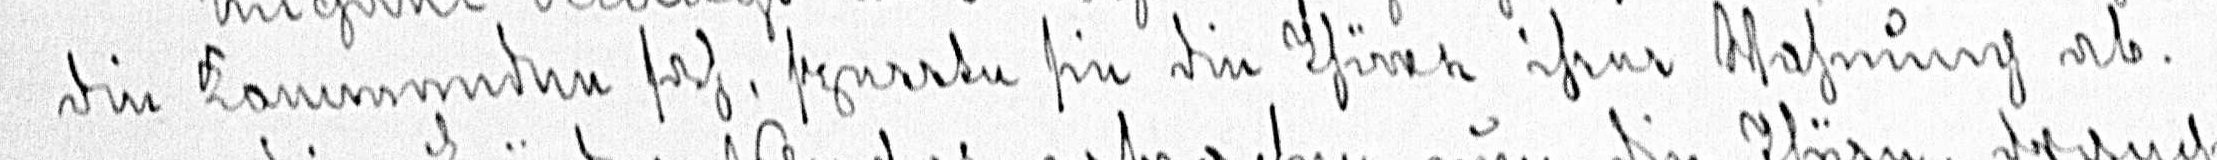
die kommenden sah, sperrte sie die Thüre ihrer Wohnung ab.
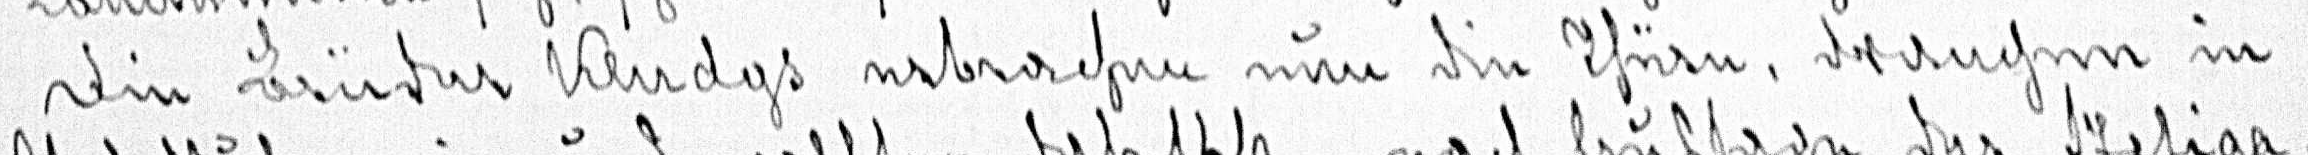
Die Brüder Kludys erbrachen nun die Thüre, drangen in
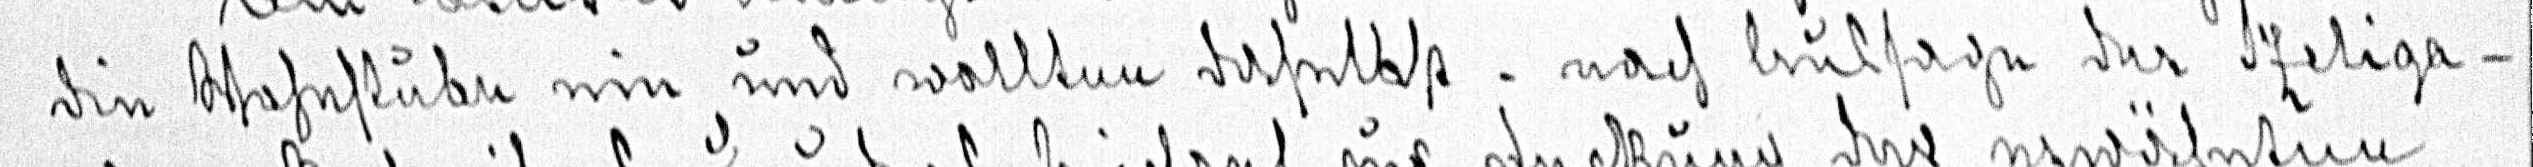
die Wohnstube ein und wollten daselbst – nach Aussage der Szeliga –
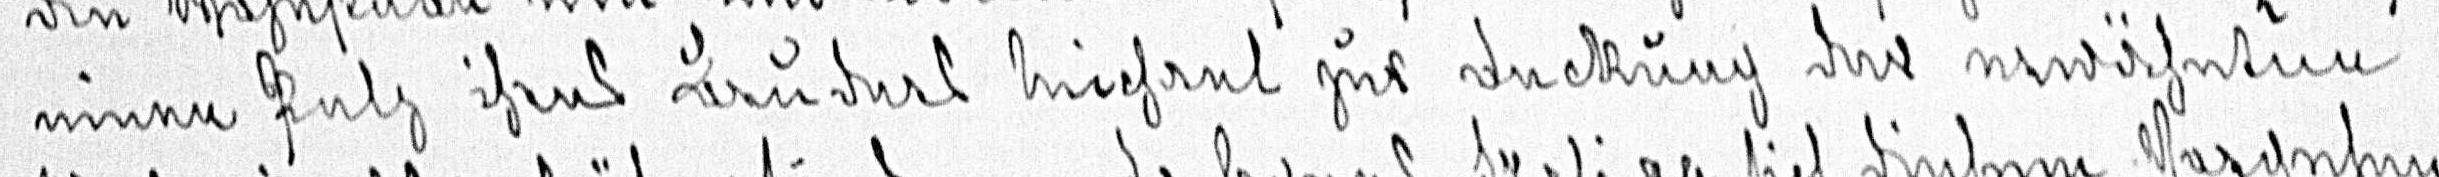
einen Pelz ihres Bruders Michael zur Deckung der erwähnten
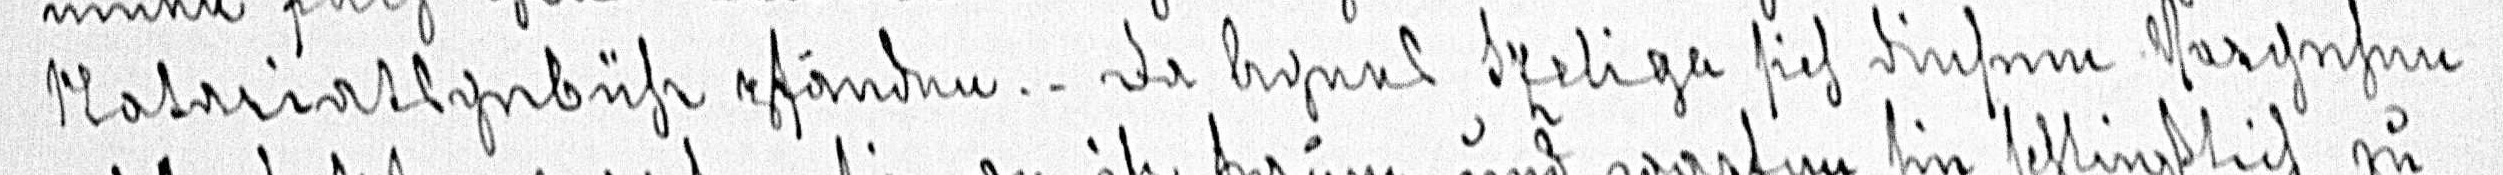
Notariatsgebühr pfänden. Da Agnes Szeliga sich diesem Vorgehen
